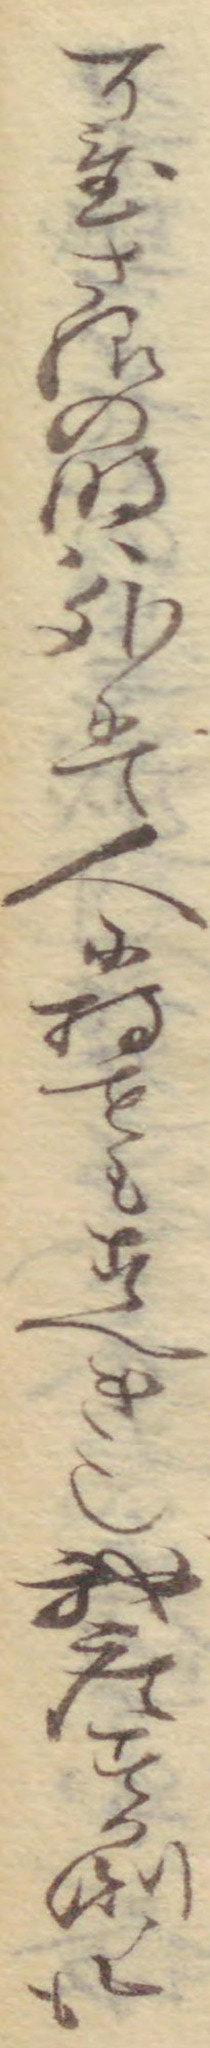可置さ様の時ハ外にて人に持せもすへき也我座する側二ても
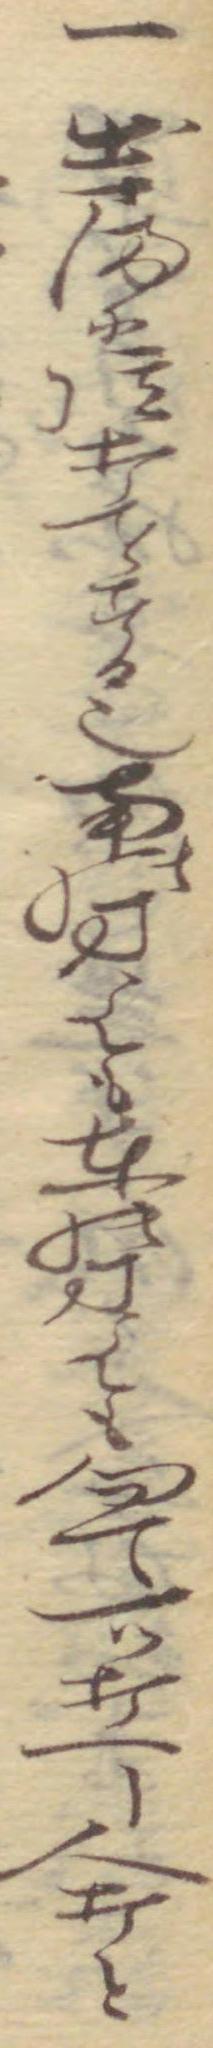一出さまに弦打をする也南の方二ても東の方ニても向て一ツ打へし人打と
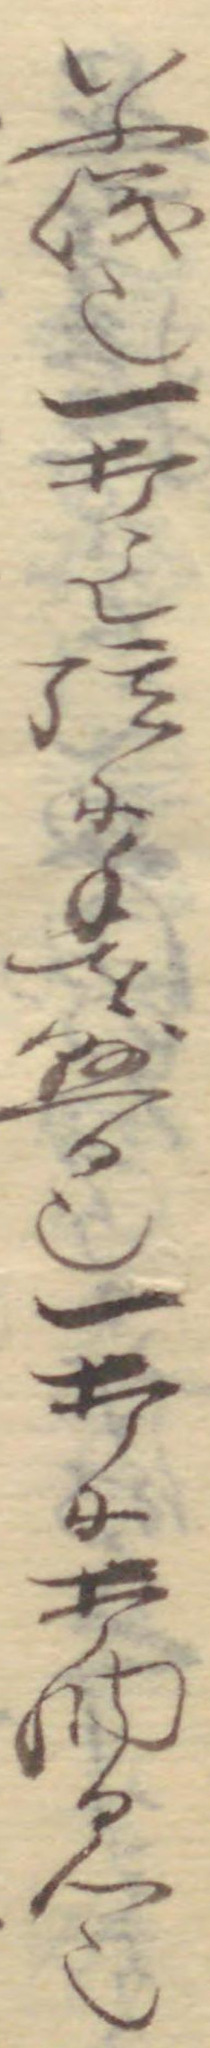いふ儀也一打ニて弦に手を懸る也一打に打納る心也
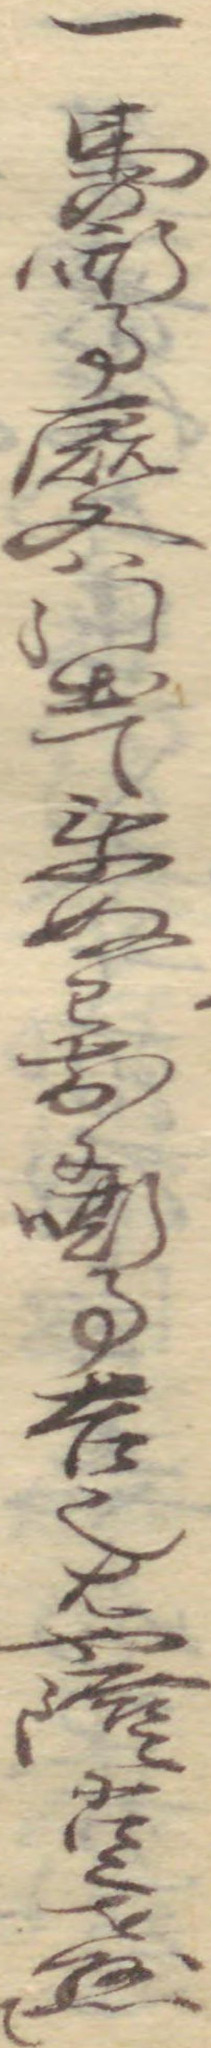一馬の嘶事厩又は引出て乗ぬ已前に嘶事吉也はや鐙に足を懸て
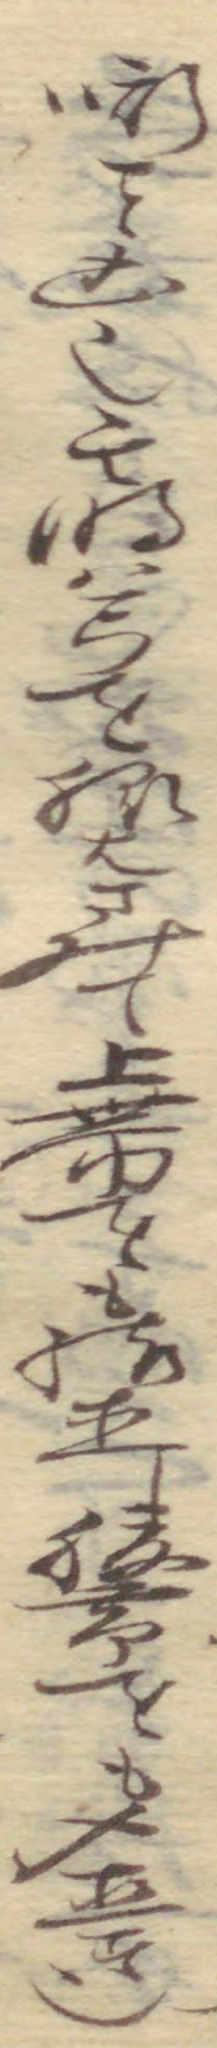嘶こと凶也其時ハ弓を脇はさみて上帯をも結直し腹帯をも〆直す也
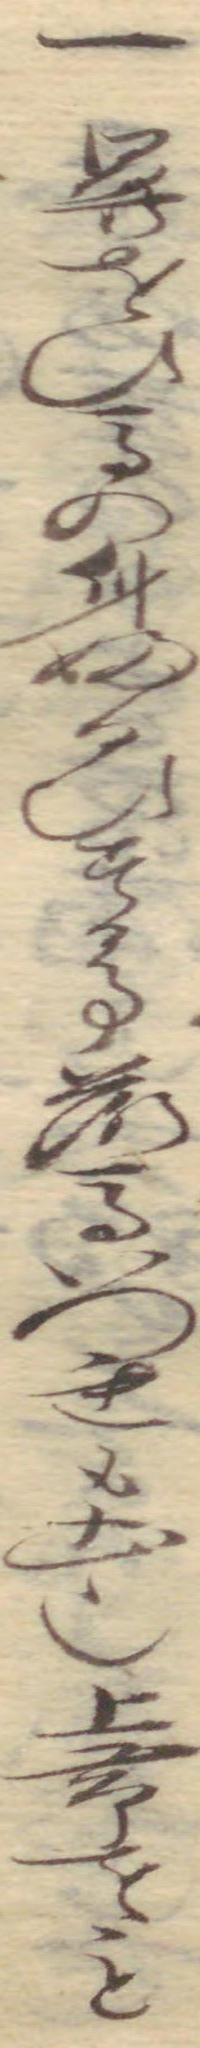一鼻をひ馬の身ふるひする事落馬いつれも凶也上帯をも
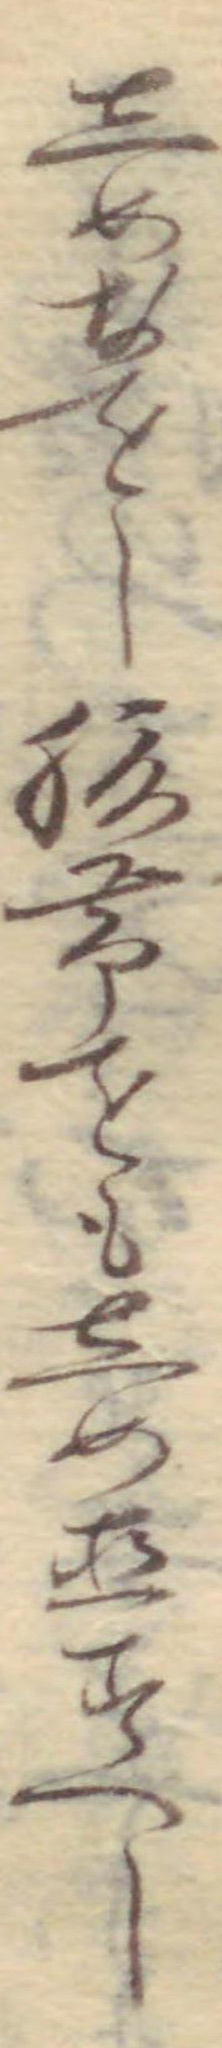しめなをし腹帯をもしめ直すへし
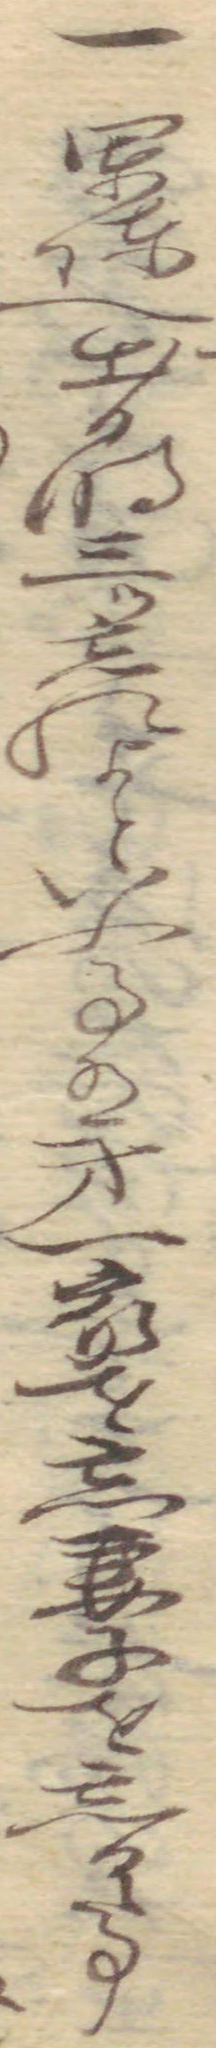一軍陣へ出る時三ツ忘れよといふ事の第一家を忘れ妻子を忘るゝ事
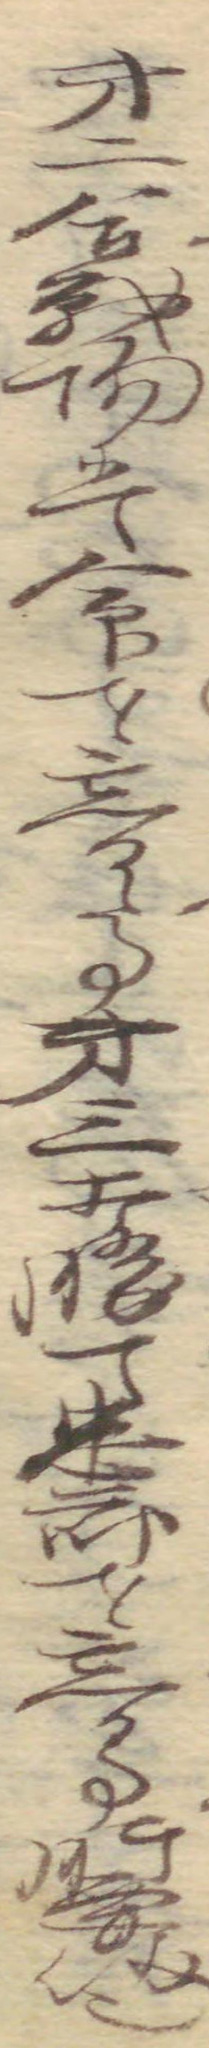第二合戦場にて命を忘るゝ事第三打勝て忠節を忘る事肝要儀也
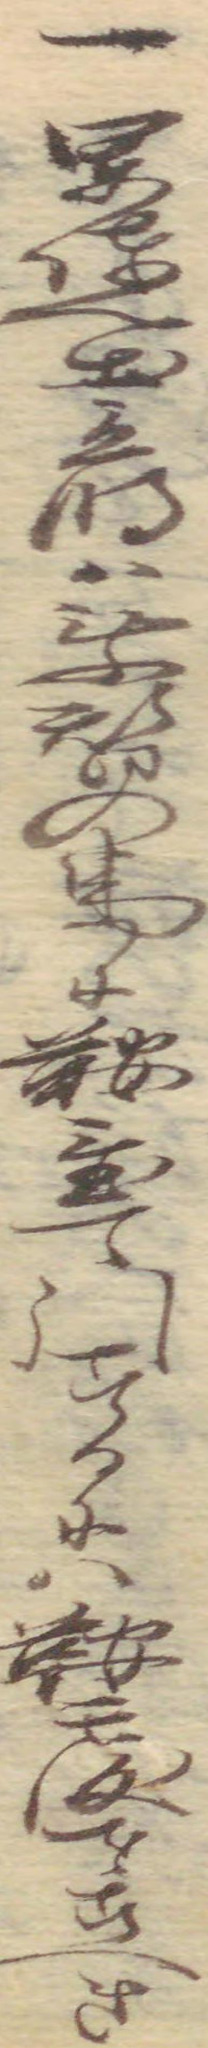一軍陣へ出立時は乗替の馬に鞍置て引するにハ鞍覆をすへき
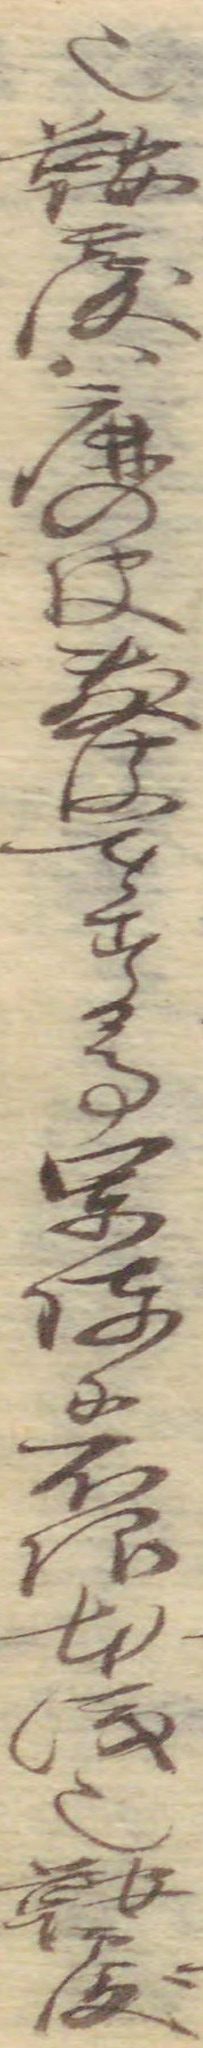也鞍覆ハ鹿の皮敷皮をする事軍陣に不限本儀也鞍覆
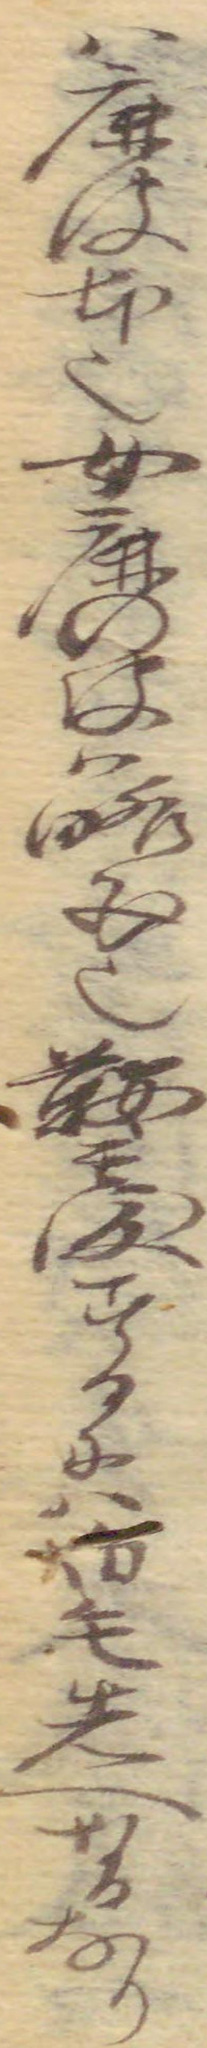ハ鹿皮本也女鹿の皮ハ略儀也鞍覆するにハ白毛先へなるなり

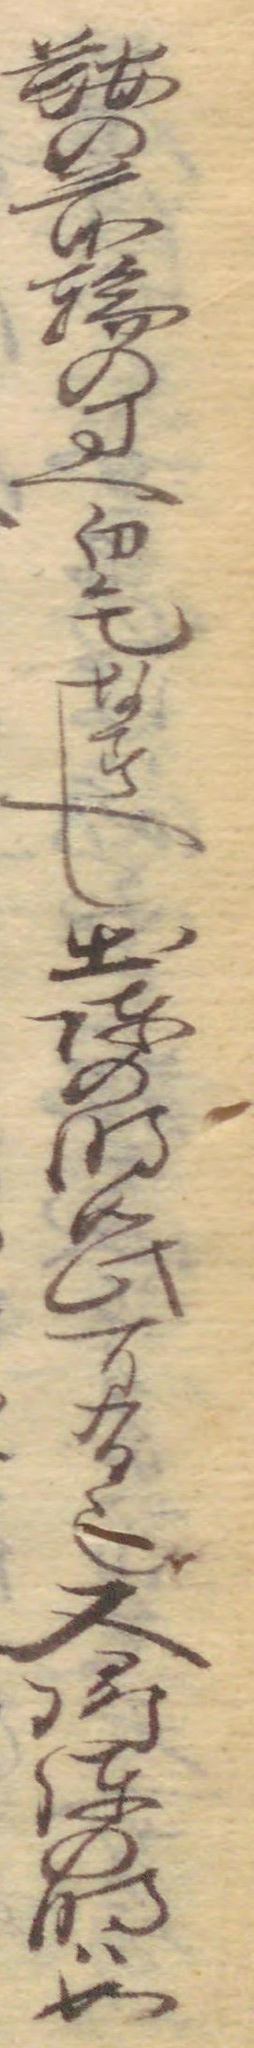鞍の前輪の方へ白毛なすへし出陣の時如此可有也又帰陣の時ハ如
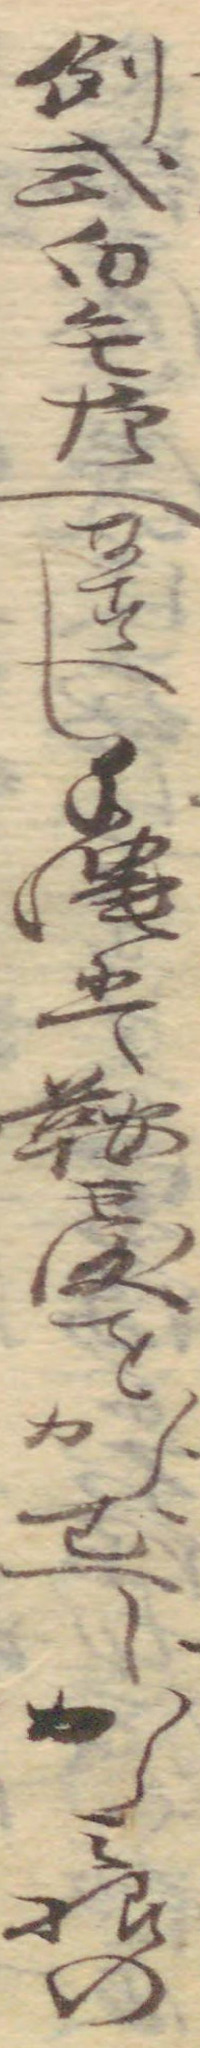例式白毛左へなすへし手縄にて鞍覆をからむへしからミ様の
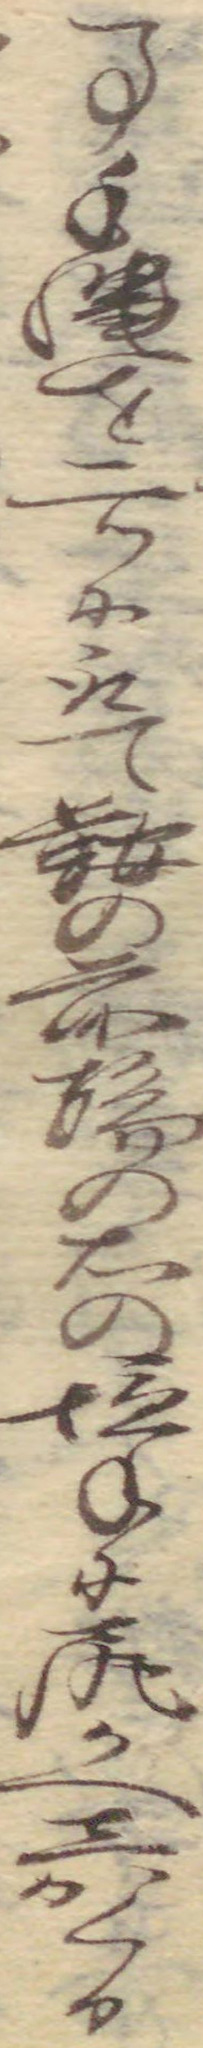事手縄をニツに取て鞍の前輪の右の塩手に尻かへしかくる
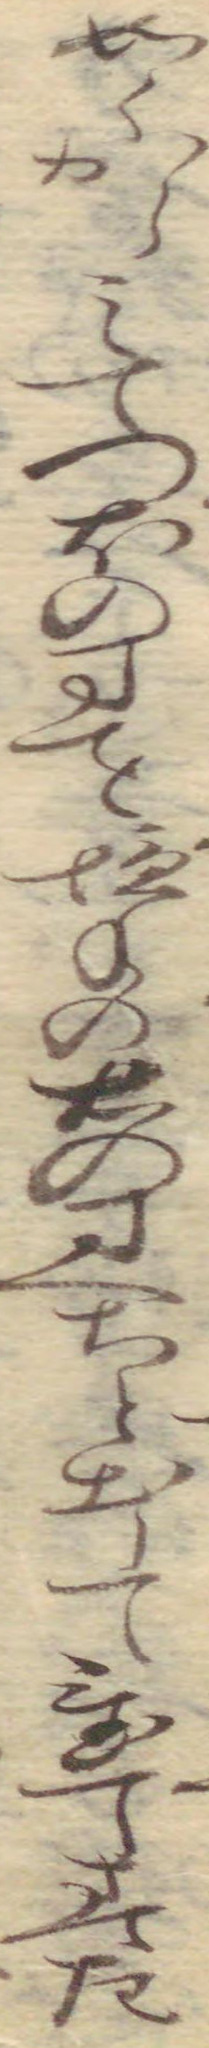如くからミてつほの方を塩手の右の方へちと出して置てさて左
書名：鶯宿雑記. 巻199-200
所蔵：国立国会図書館 National Diet Library, JAPAN
